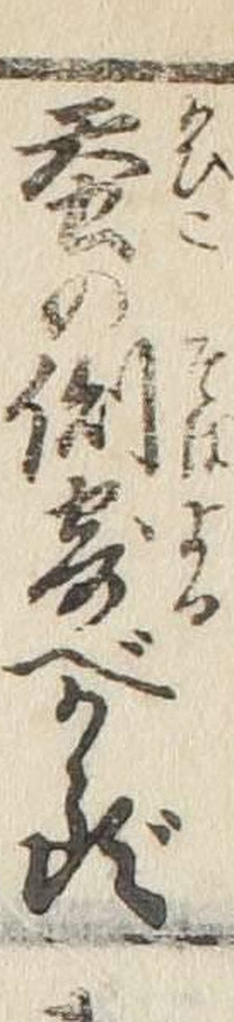蚕の側寄べからず
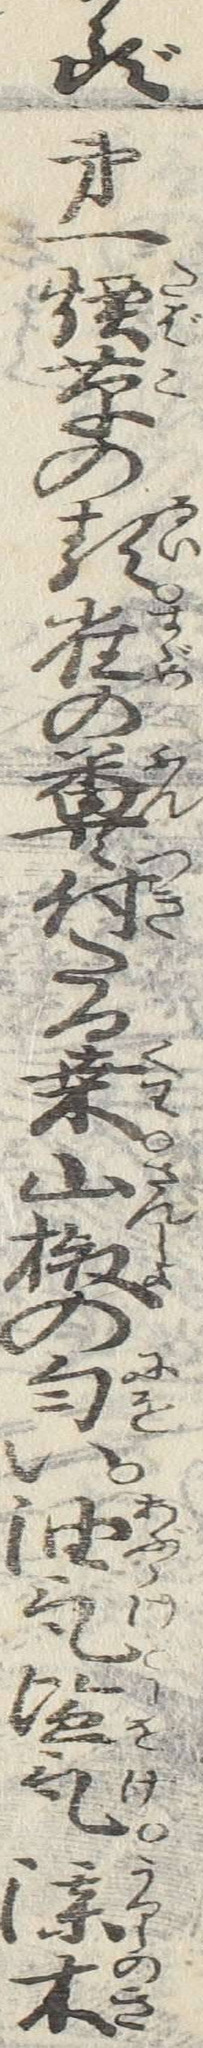第一煙草の類。雀の糞付たる桑。山椒の匂い。油気。塩気。漆木
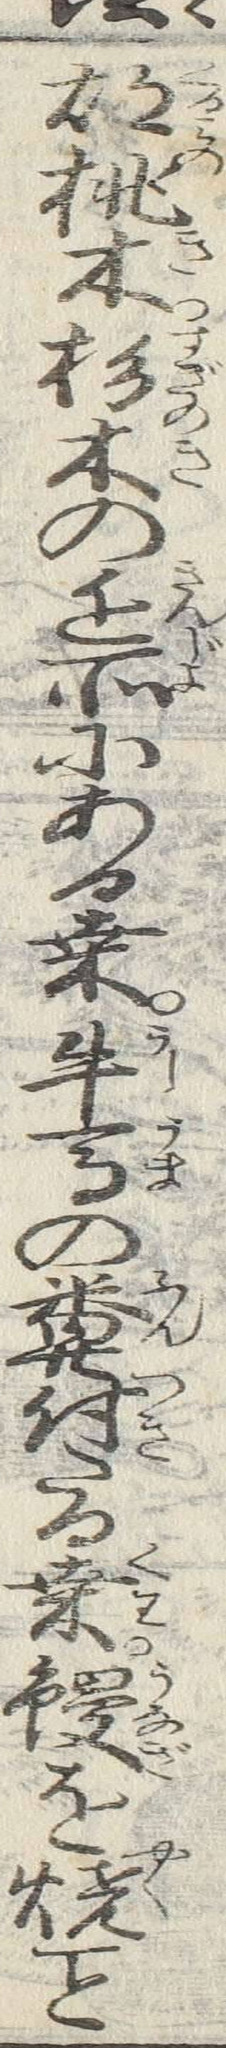胡桃木。杉木の近所にある桑。牛馬の糞付たる桑。鰻を焼こと
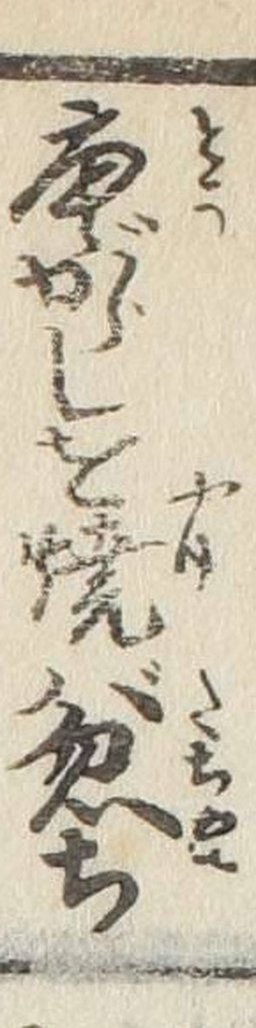唐がらしを焼ば忽ち
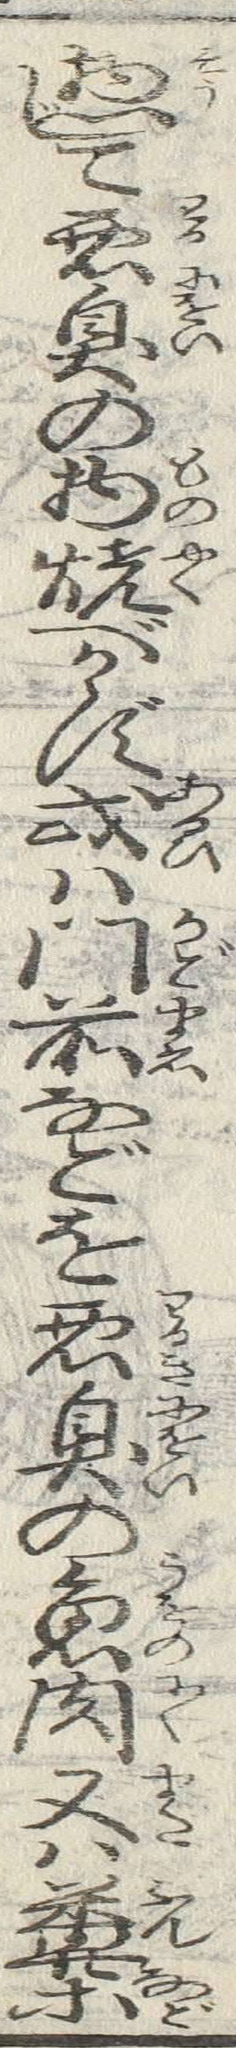惣じて悪臭の物焼べからず或は門前などを悪臭の魚肉又は糞等
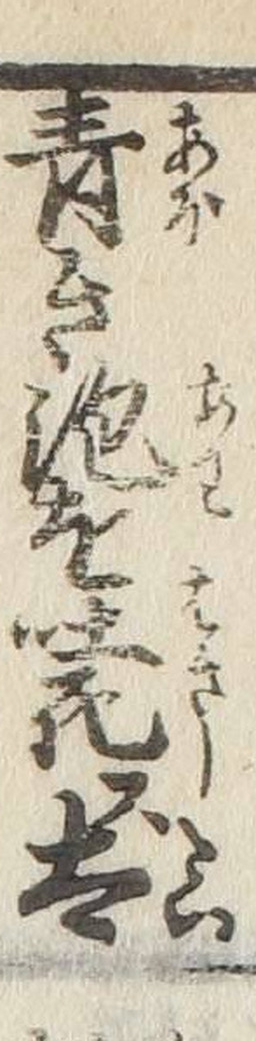青き泡を吐死す太
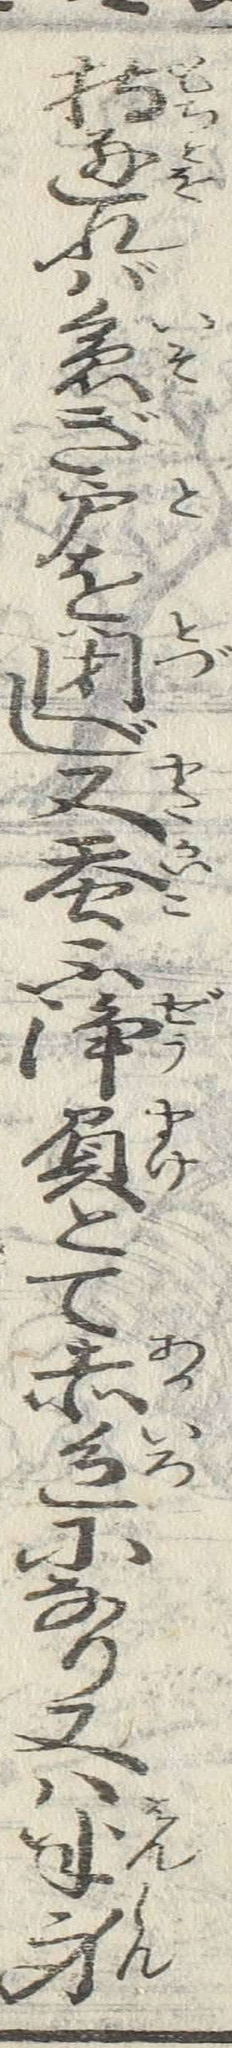持通れば急ぎ戸を閉べし又蚕ふ浄負とて赤色になり又は半身
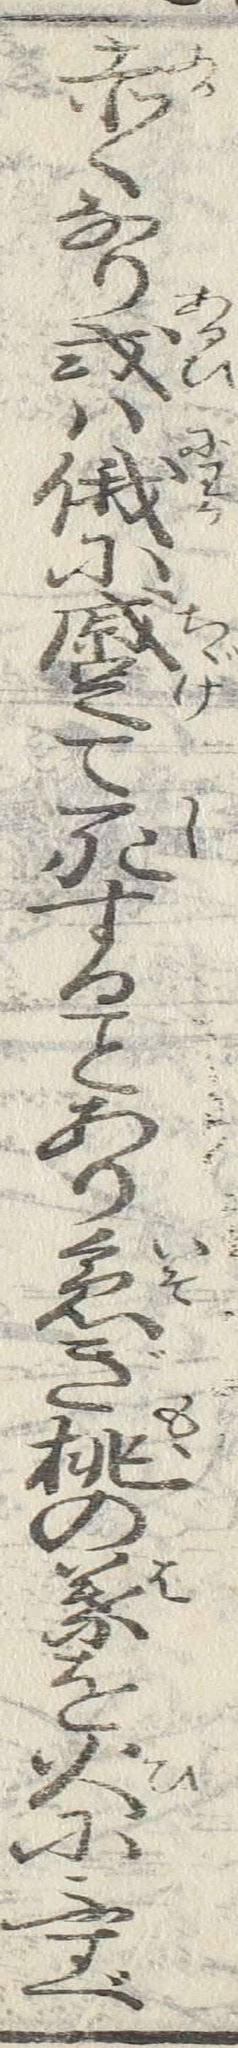赤くなり或は俄に蹙て死することあり急ぎ桃の葉を火にふすべ
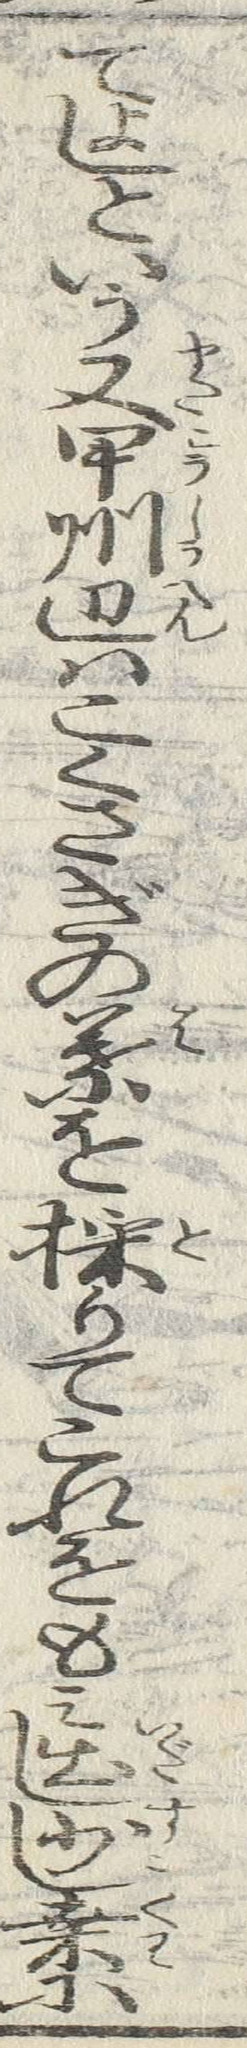てよしという又甲州辺はこくさぎの葉を採りてこれをもみ出し少し桑に
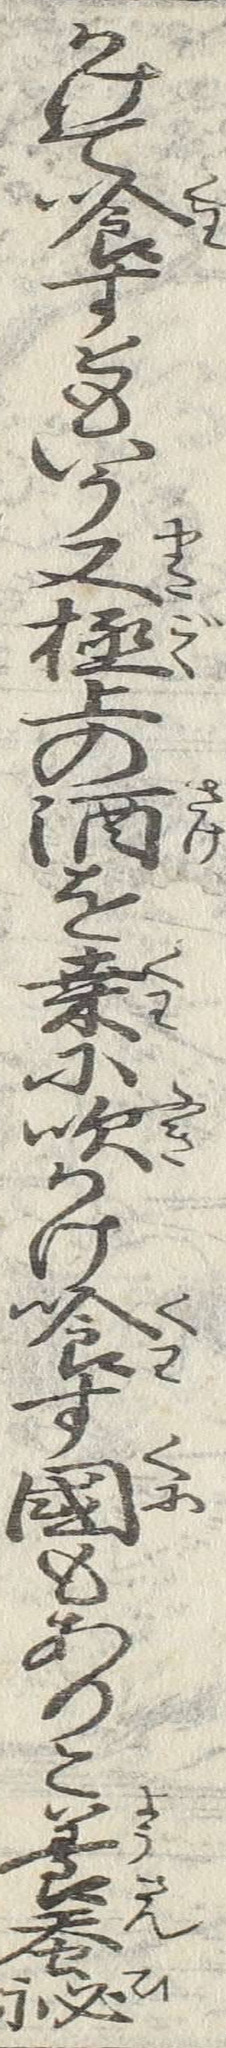かけて喰すともいう又極上の酒を桑に吹かけ喰す國もありと養蚕秘
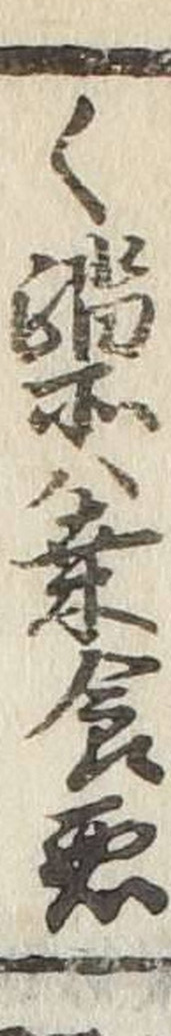く踏所は桑食悪
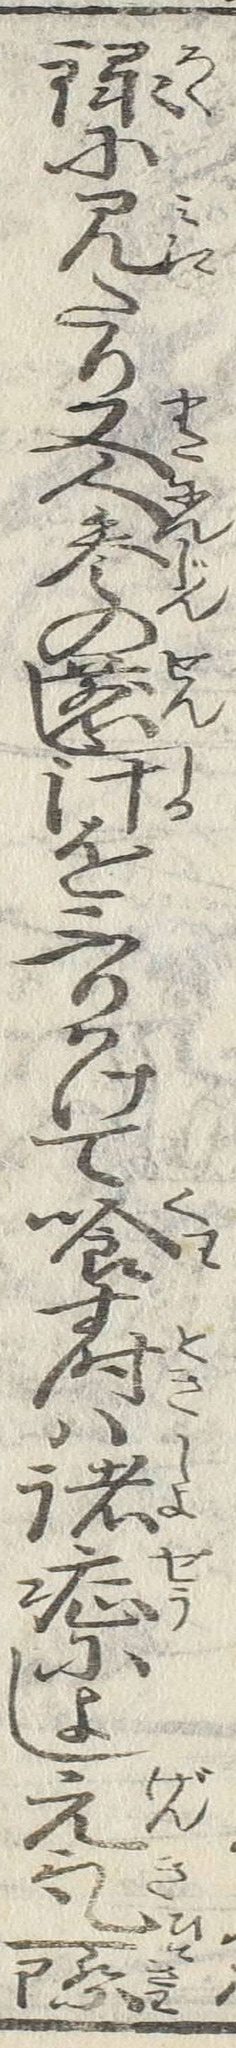録に見たり又人参の煎し汁をふりかけて喰す時は諸症によし元気一際
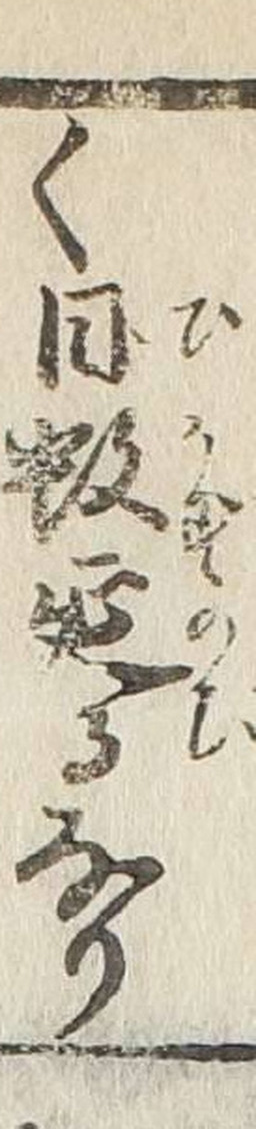く日数延るなり
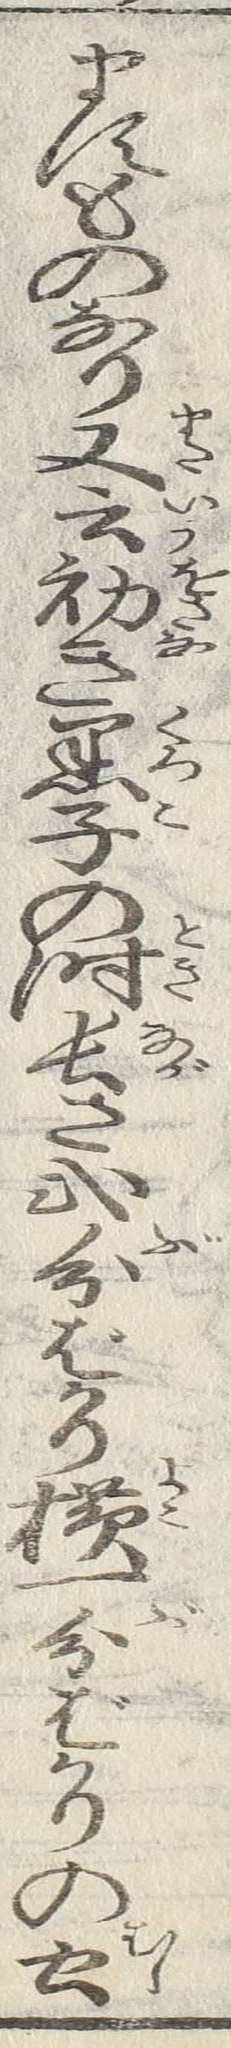ますものなり又云幼き黒子の時長さ弐分ばかり横一分ばかりの虫
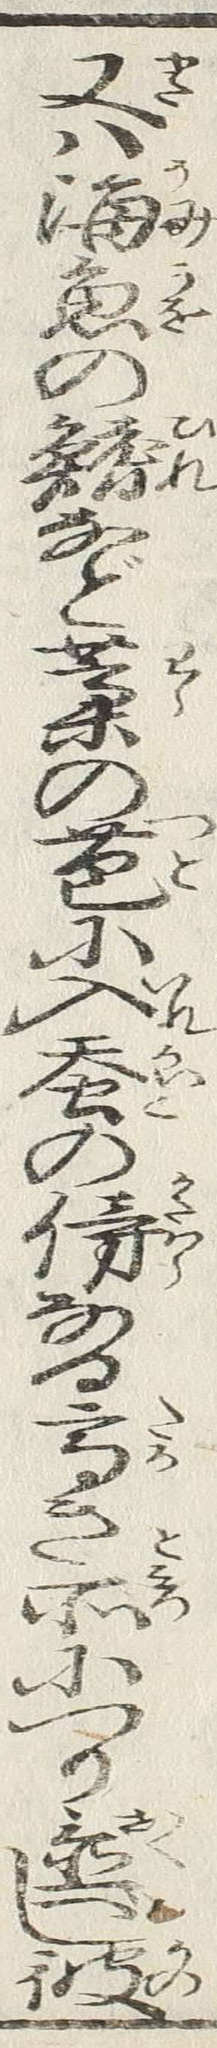又は海魚の鰭など藁の苞に入蚕の傍なる高き所につり置べし彼
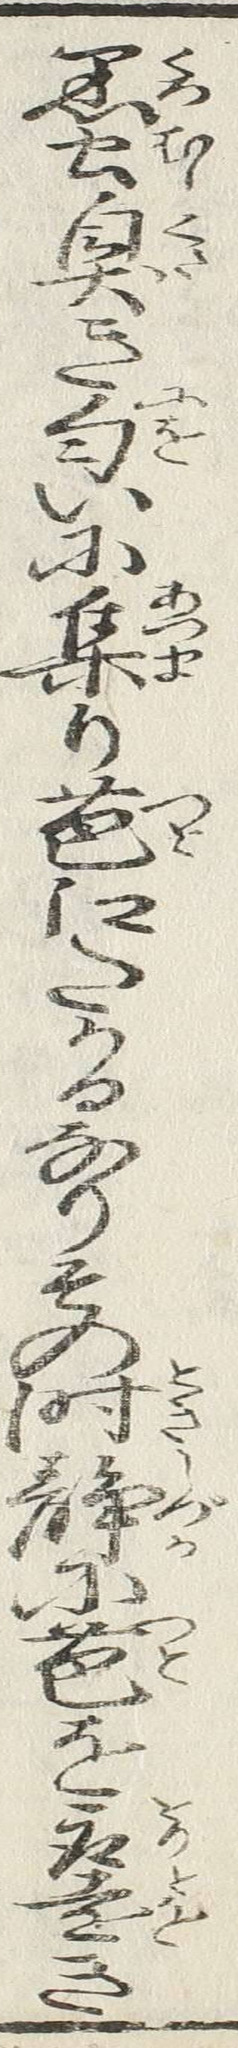黒虫臭き匂いに集り苞えたかるなりその時静に苞を取遠き
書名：養蠶實驗録
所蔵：東京大学農学生命科学図書館 国文学研究資料館
